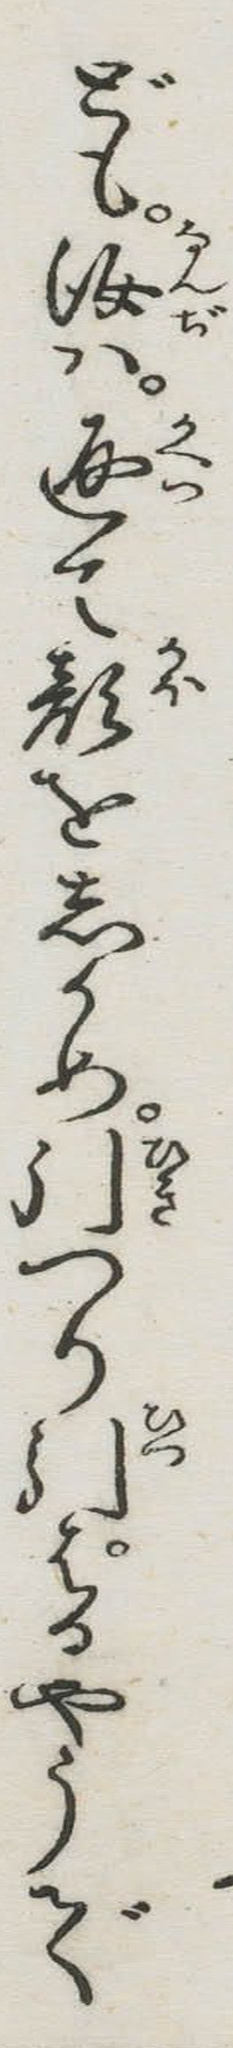ども。汝は。返て顔をしかめ。引つり引ぱるやうで
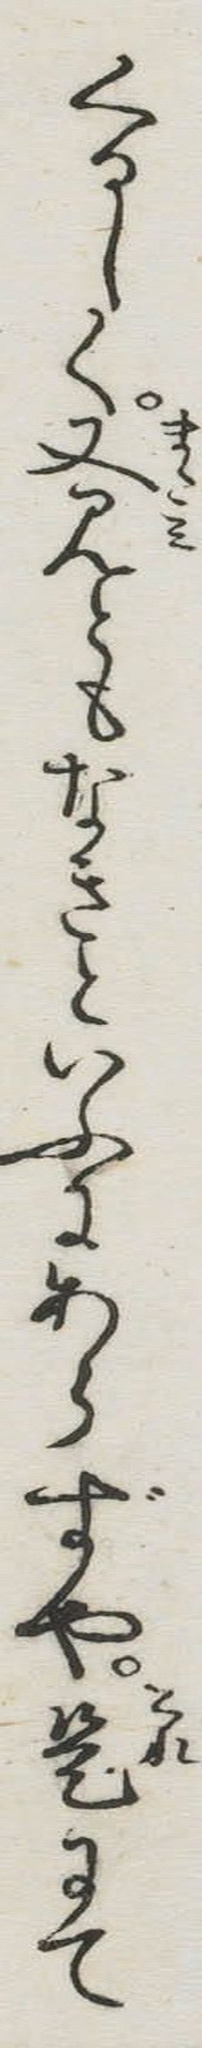くるしく。又見ともなきといふにあらずや。是にて
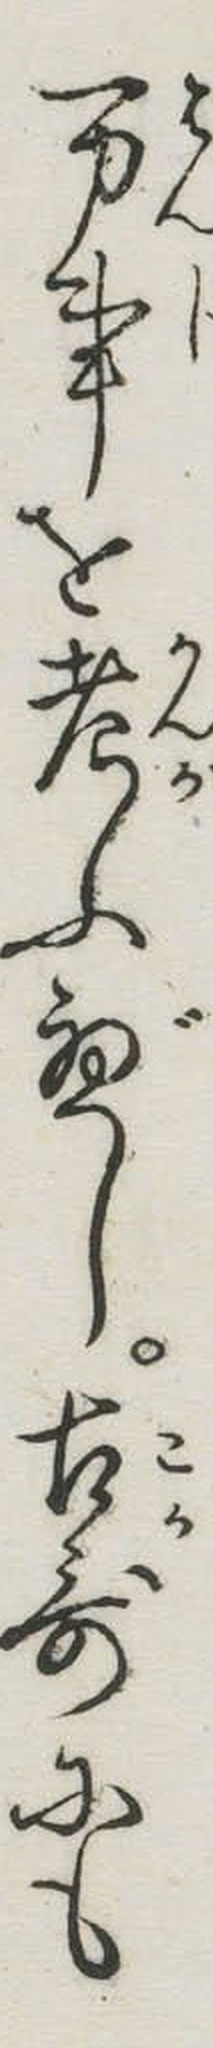万事を考ふべし。古哥にも
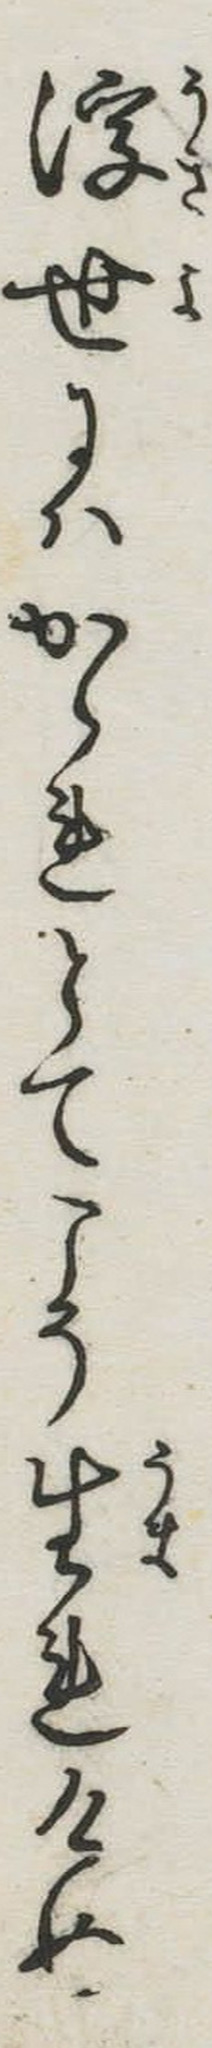浮世にはかゝれとてこそ生れけめ
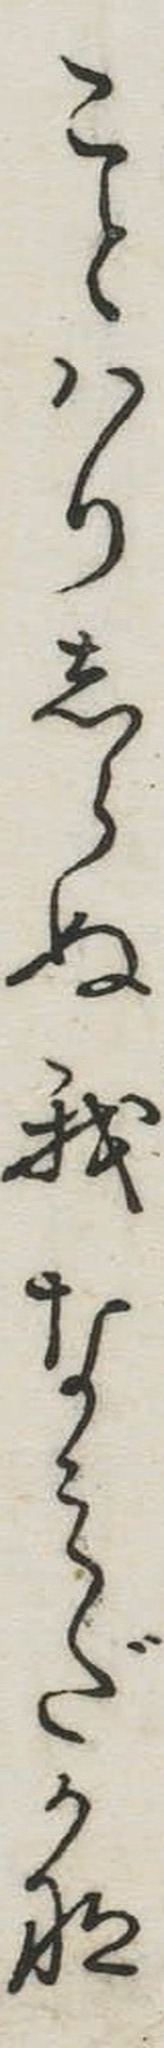ことはりしらぬ我なみだかな
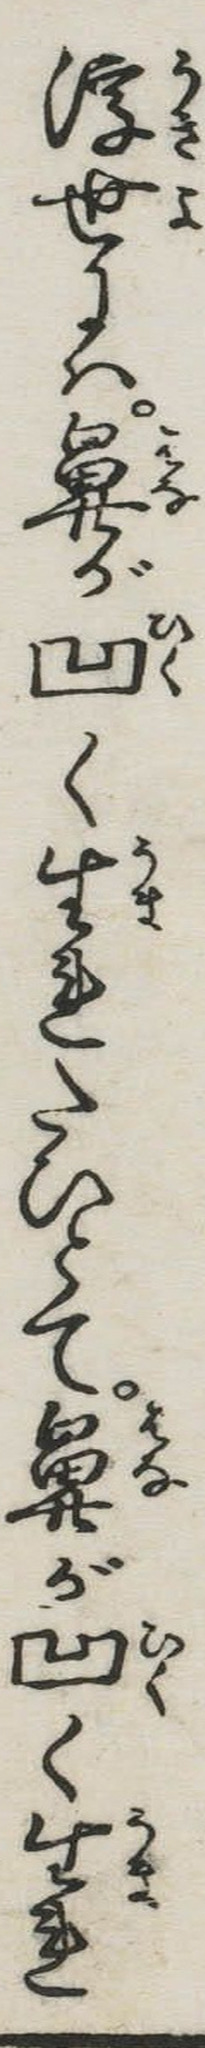浮世には。鼻が凹く生れたひとて。鼻が凹く生れ

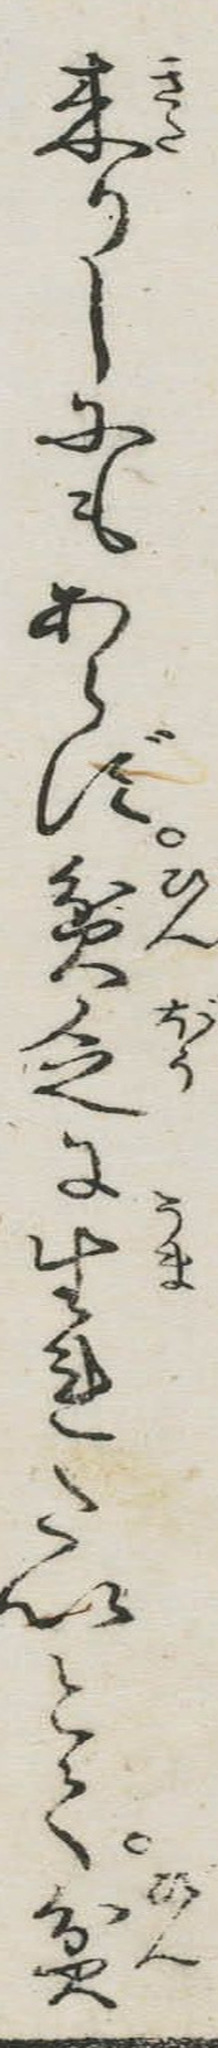来りしにもあらず。貧乏に生れたいとて。貧
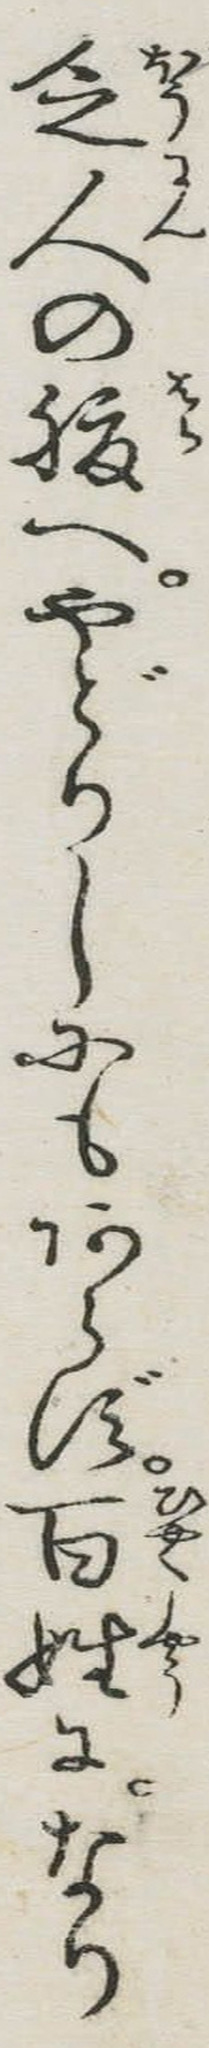乏人の腹へ。やどりしにもあらず。百姓に。なり
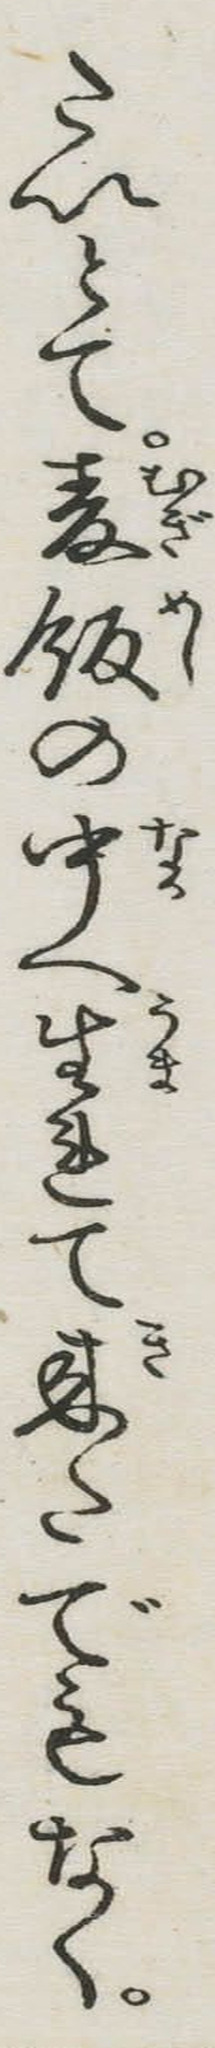たいとて。麦飯の中へ生れて来たでもなく。
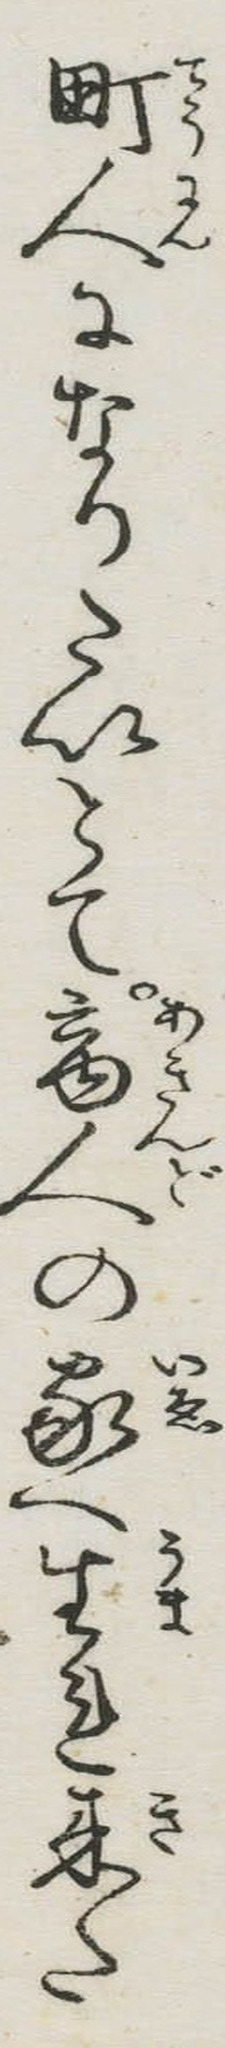町人になりたいとて。商人の家へ生れ来た
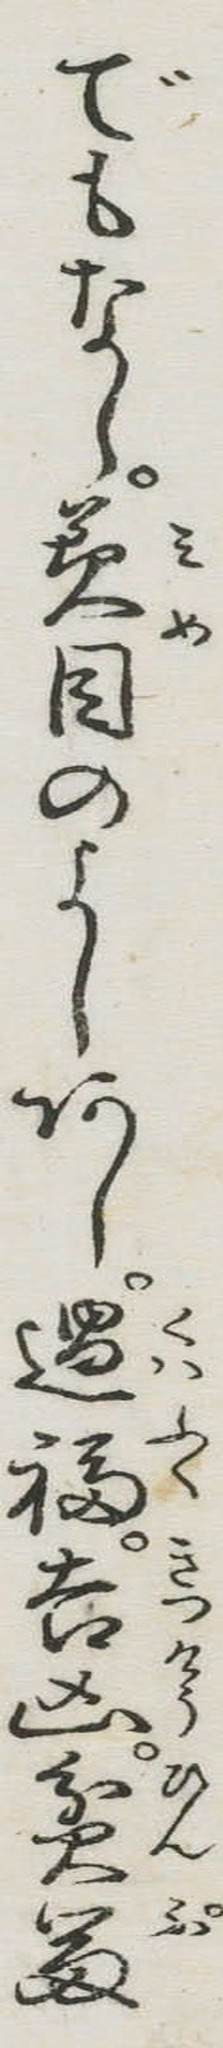でもなし。美目のよしあし。過福。吉凶。貧富
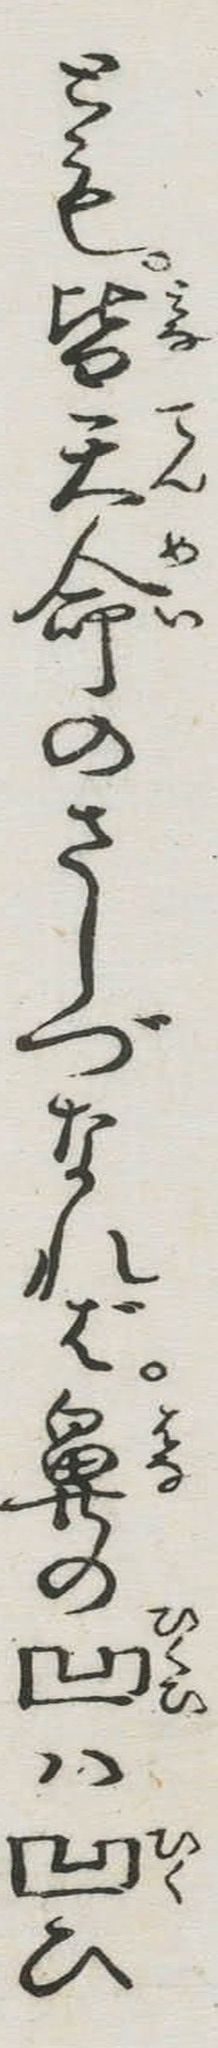とも。皆天命のさしづなれば。鼻の凹は凹ひ
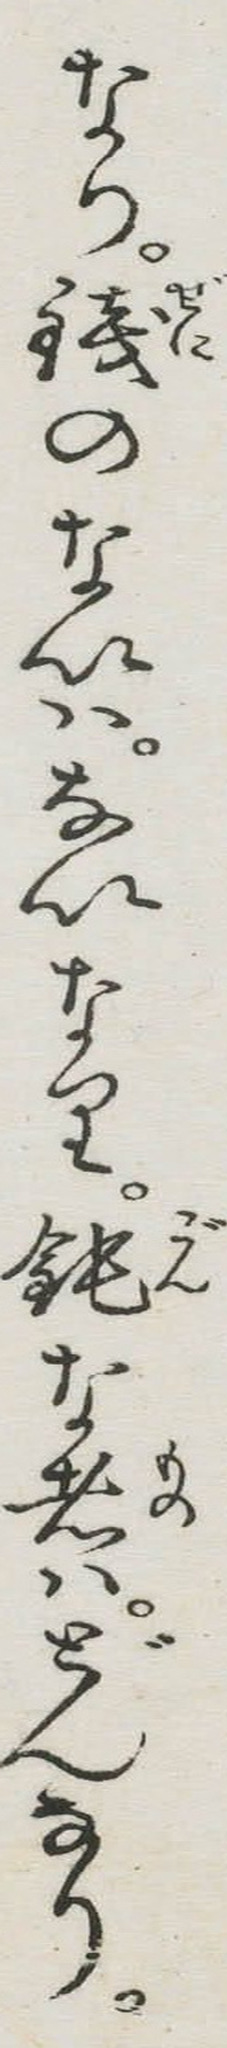なり。銭のないは。ないなり。鈍な者は。どんなり。
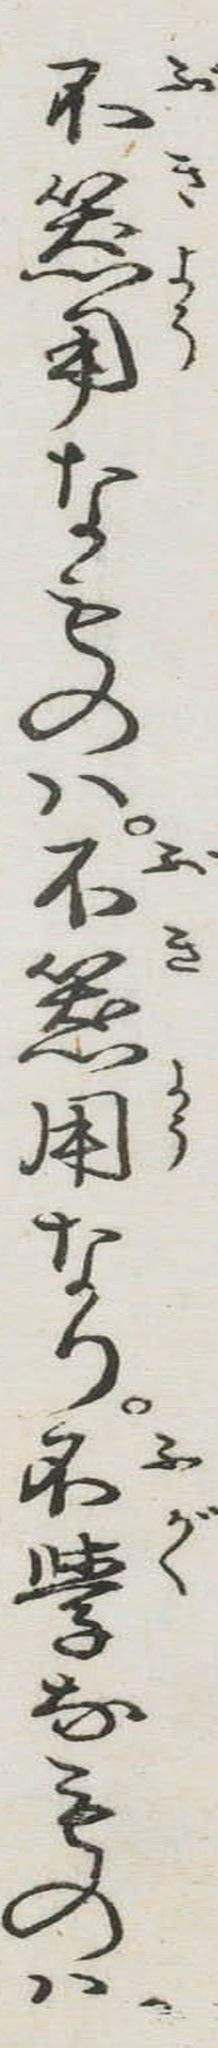不器用なものは。不器用なり。不学なものは。
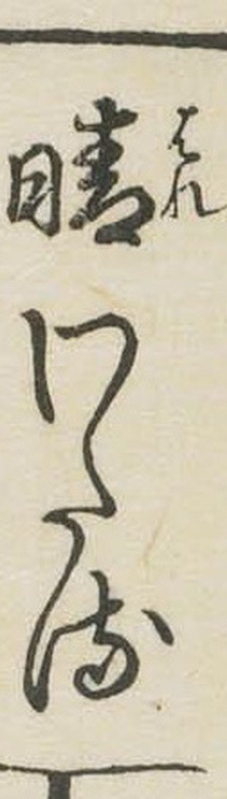晴わたる
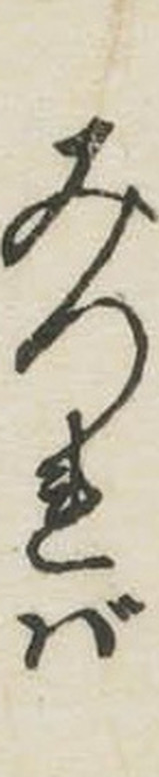みつれば
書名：福神おしへの小槌 2巻 上
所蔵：東京学芸大学教育コンテンツアーカイブ
